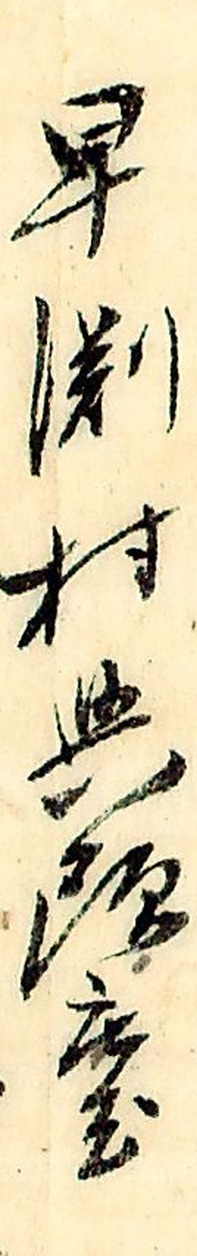早淵村与頭庄屋
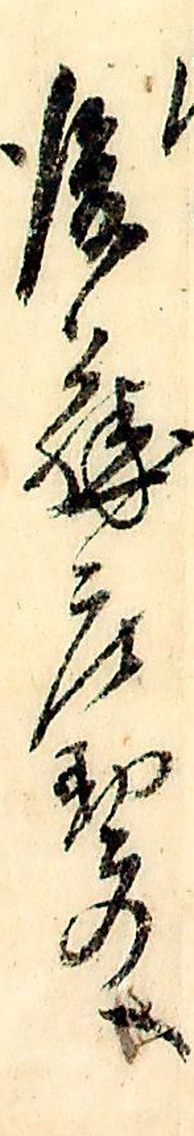後藤庄助とのへ
